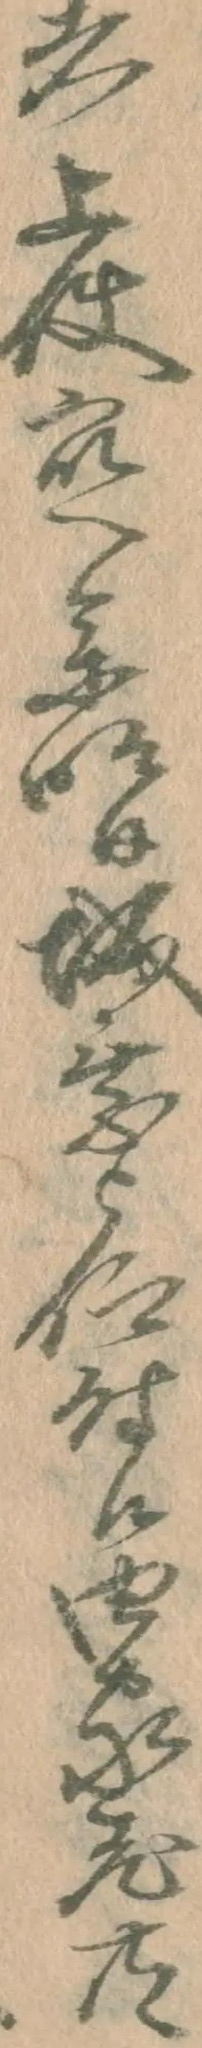者上使衆へ参明日城乗被仰付候由家老共
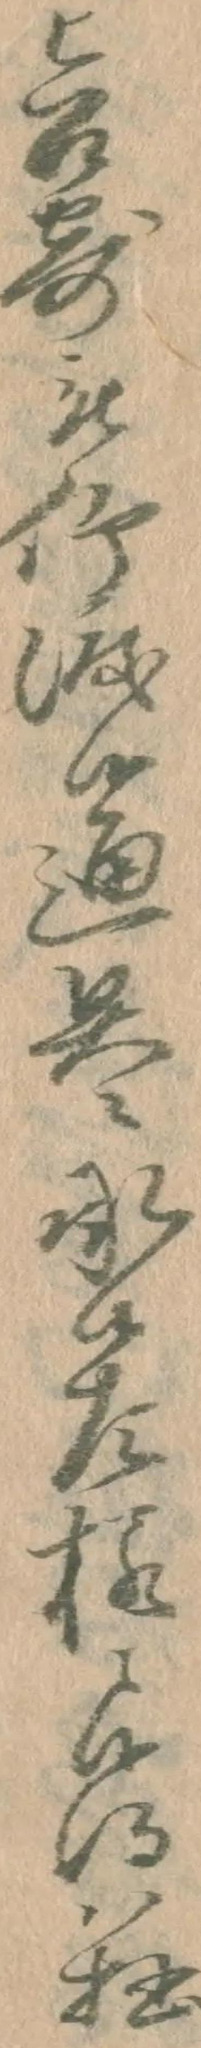被召寄被仰渡候通具に承候左様に候得は拙
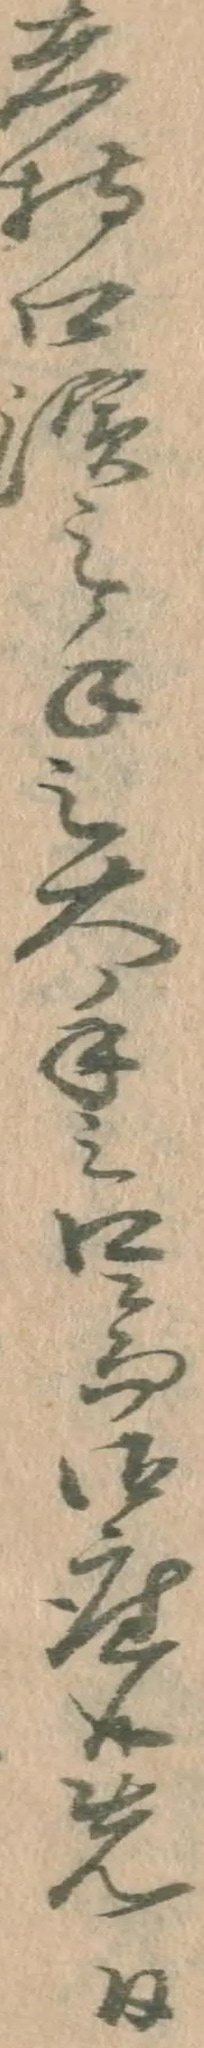者持口浜之手之大手之口に而御座候先日
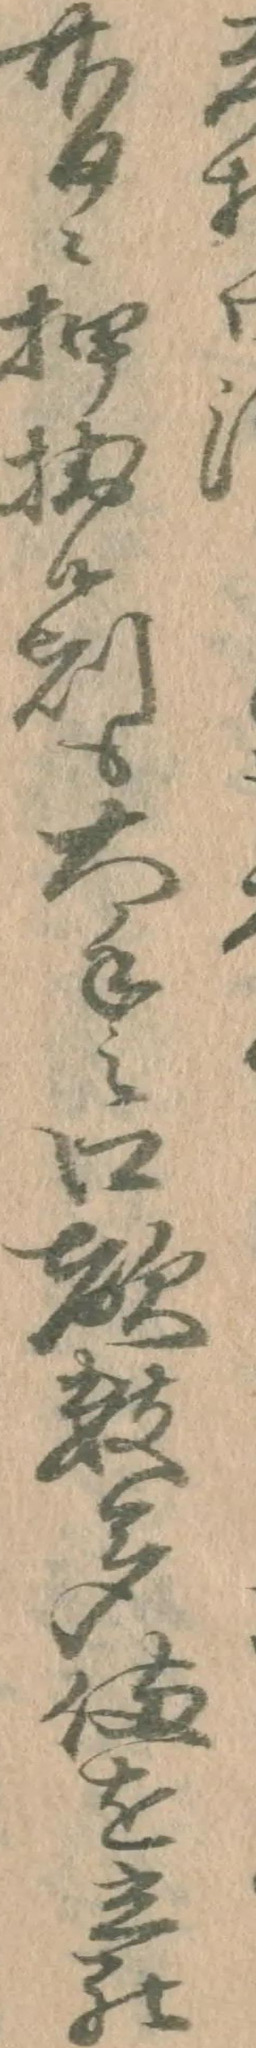廿日に押掛候刻も大手之口敵数多備を立罷
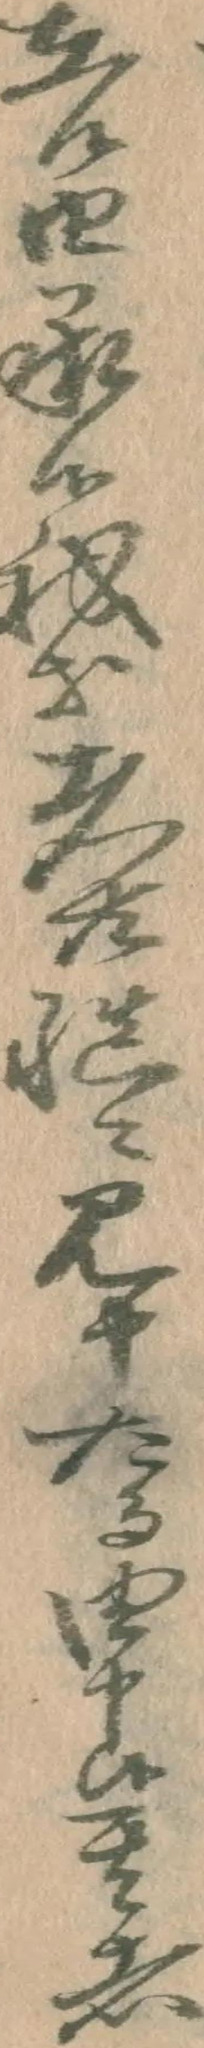在候由承候我等者共慥に見申たる由申候其者
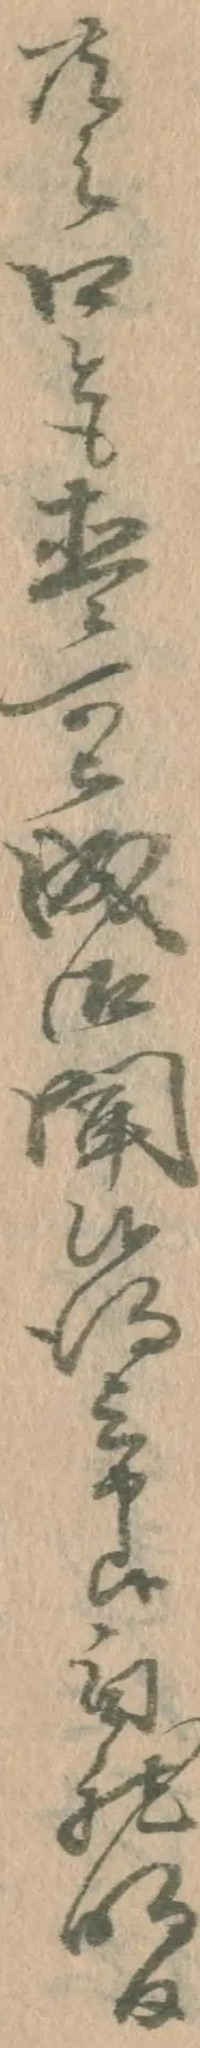共之口とも直に可被成御聞候得与申候自然明日
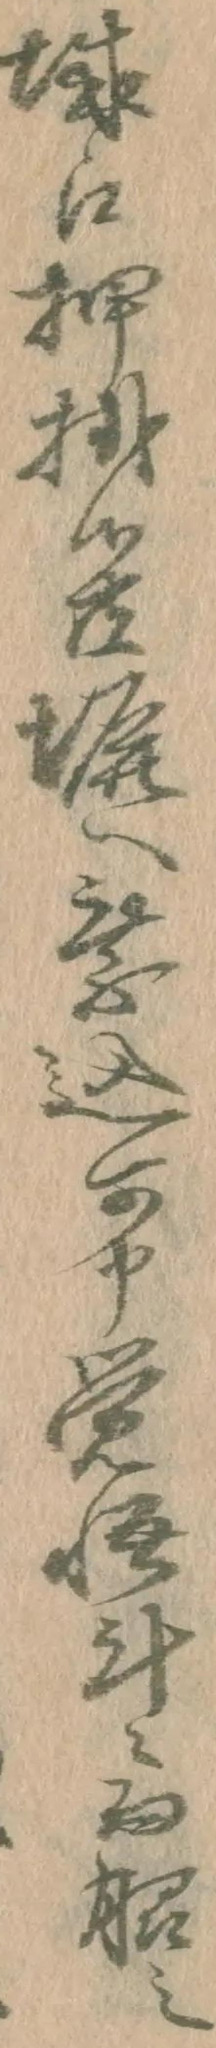城江押掛候共塀へ乗込可申覚悟斗に而脇之
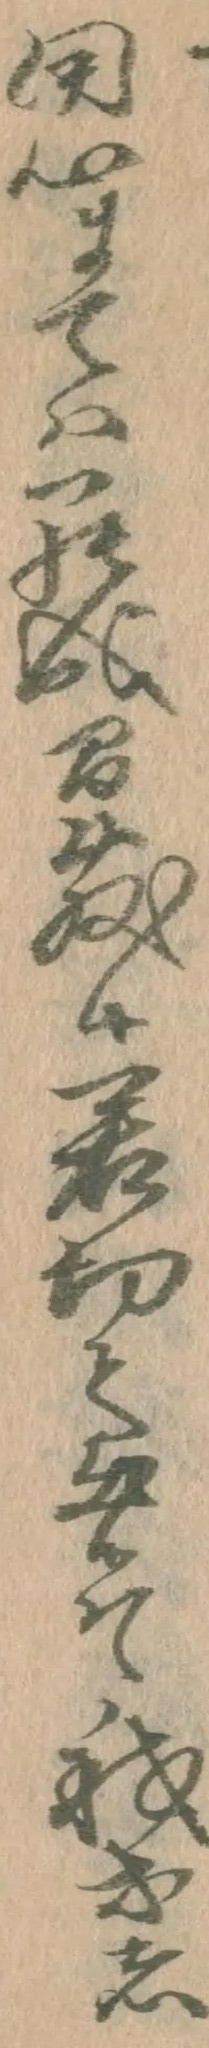用心まては罷成間敷候若切て出候はゝ我等者
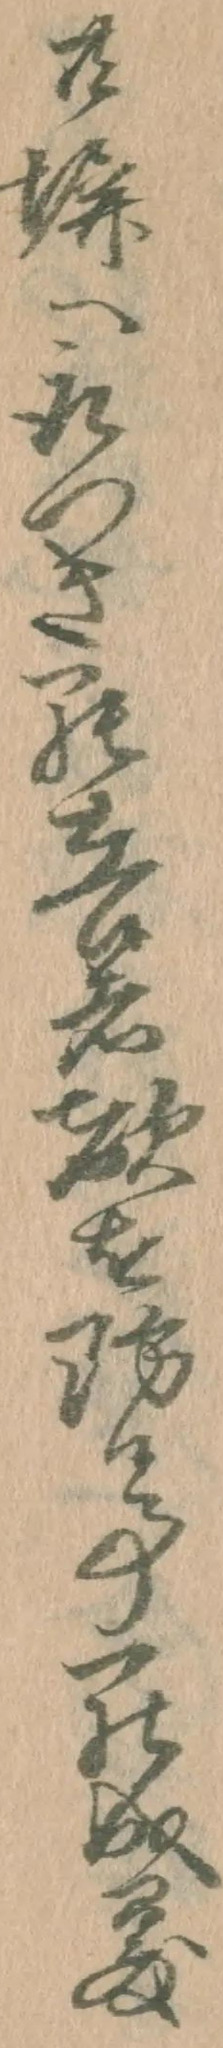共塀へ取つき罷在候者敵を防候事罷成間敷
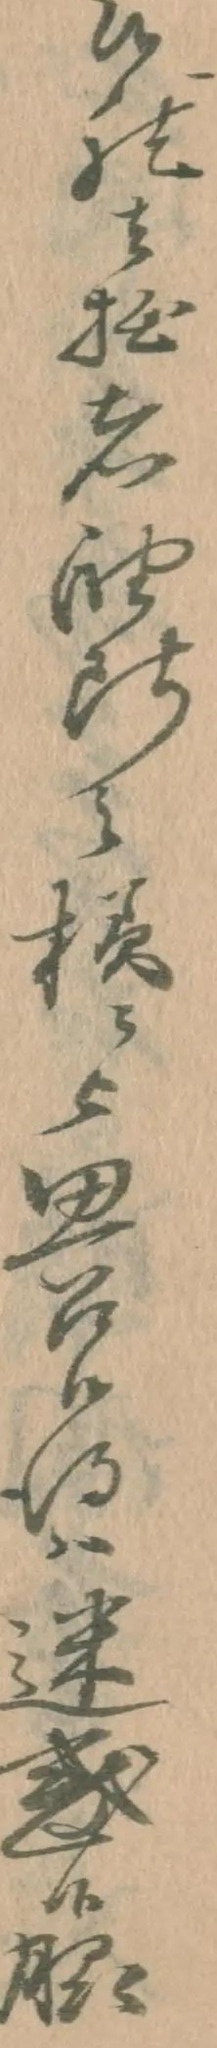候然は拙者油断之様に被思召候得は迷惑候脇
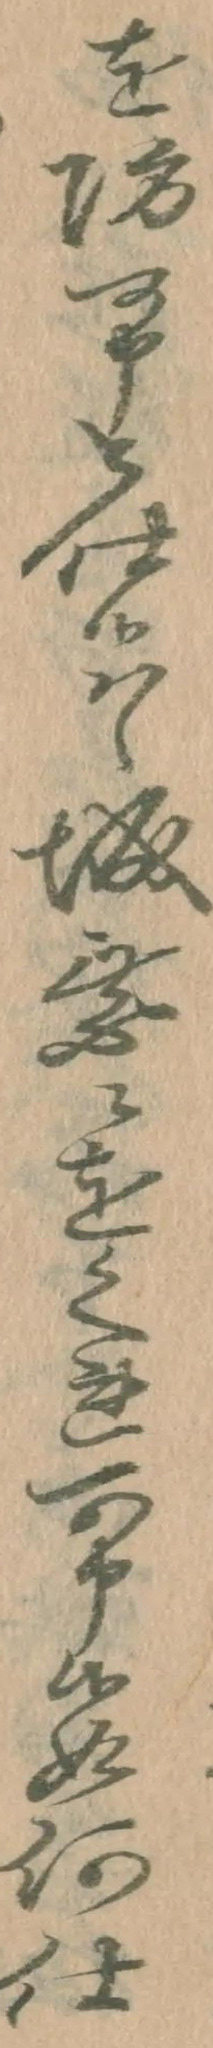を防可申と仕候はゝ城乗にをく連可申候如何仕
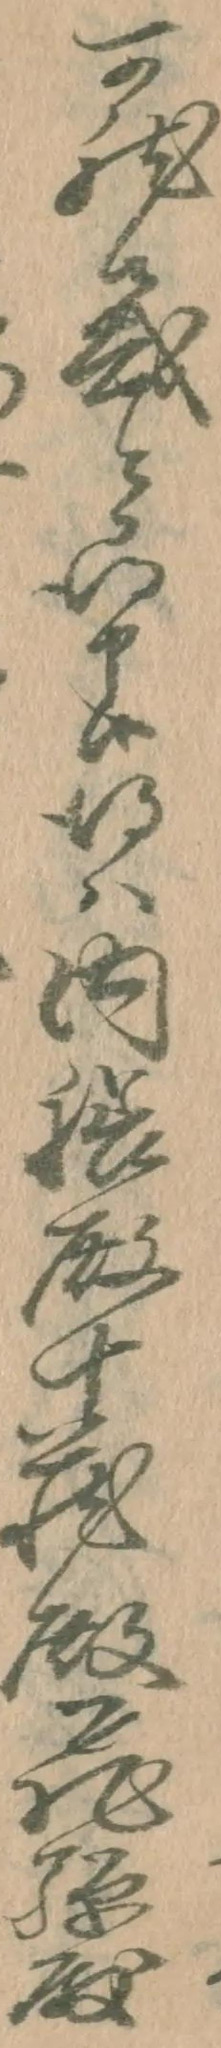可然候哉と尋申候得は内膳殿十蔵殿飛騨殿
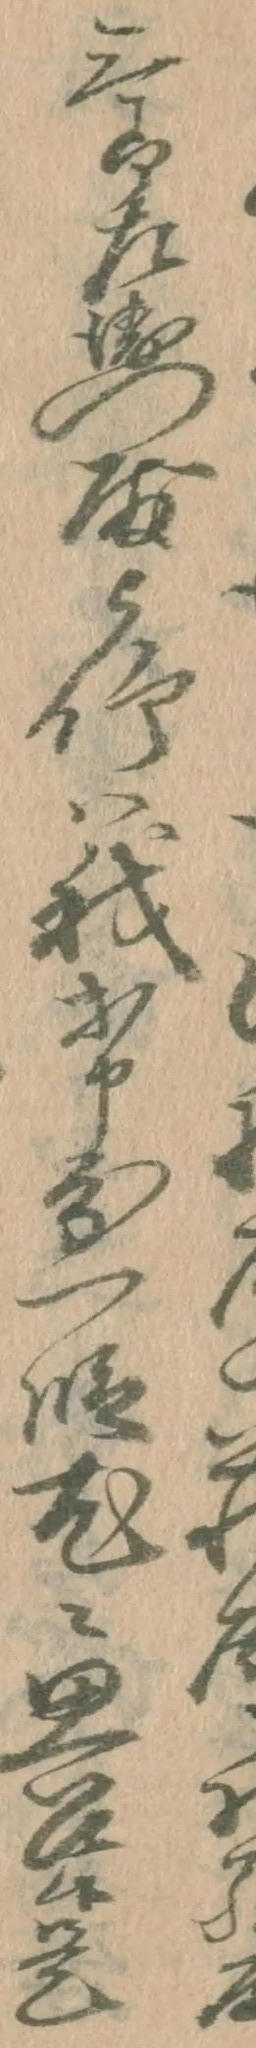三郎左衛門殿被仰は我等申分一段尤に思召候是
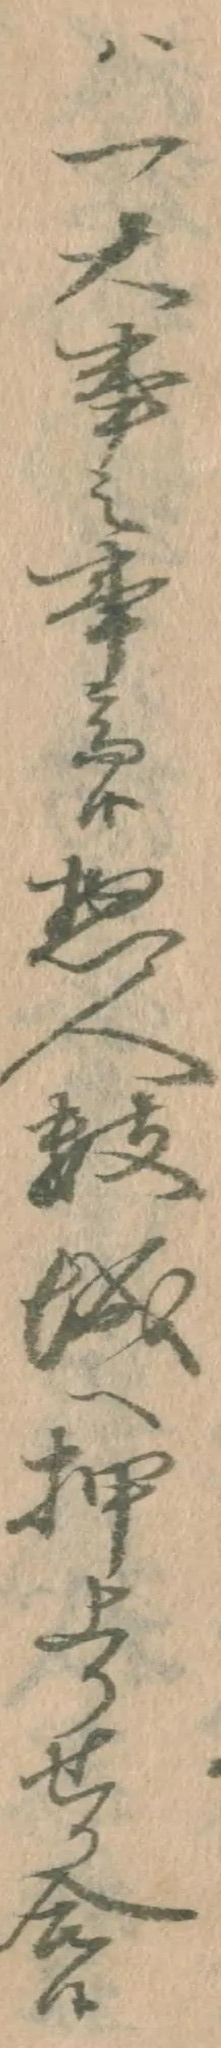は一大事之事に而候惣人数城へ押上りせり合候
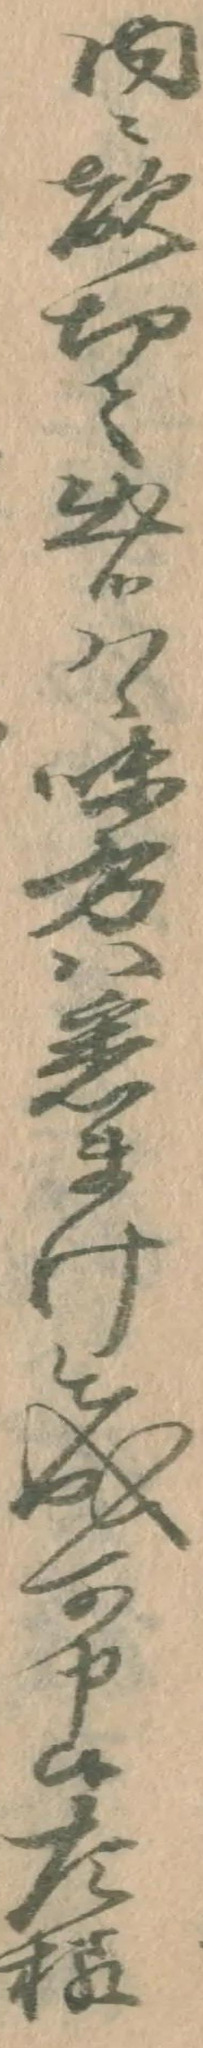内に敵切て出候はゝ味方は悉まけと成可申候左様
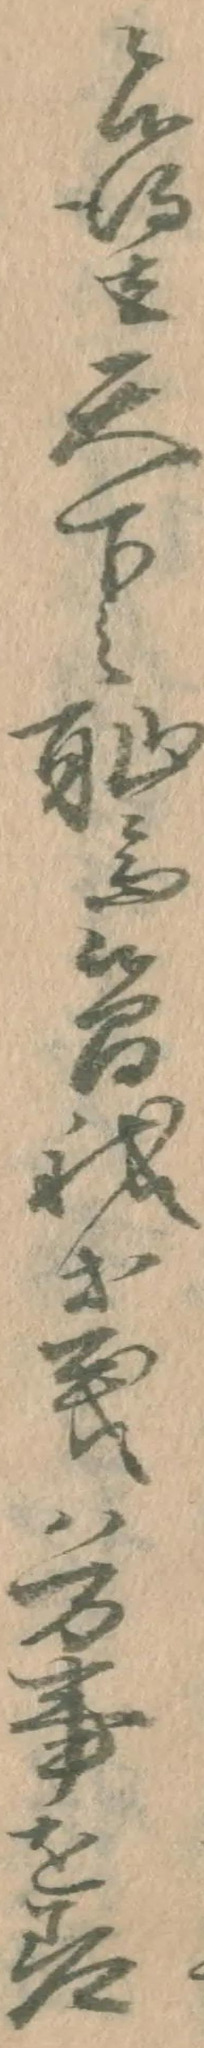に候得者天下之耻に而候間我等義は万事を差
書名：切支丹御退治記 49巻. [5]
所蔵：国立国会図書館 National Diet Library, JAPAN
